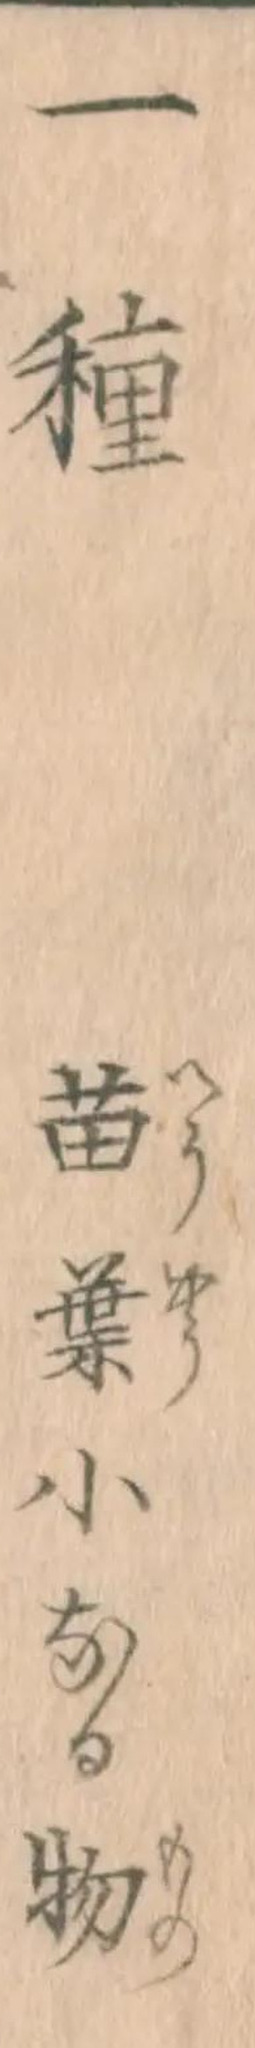一種苗葉小なる物
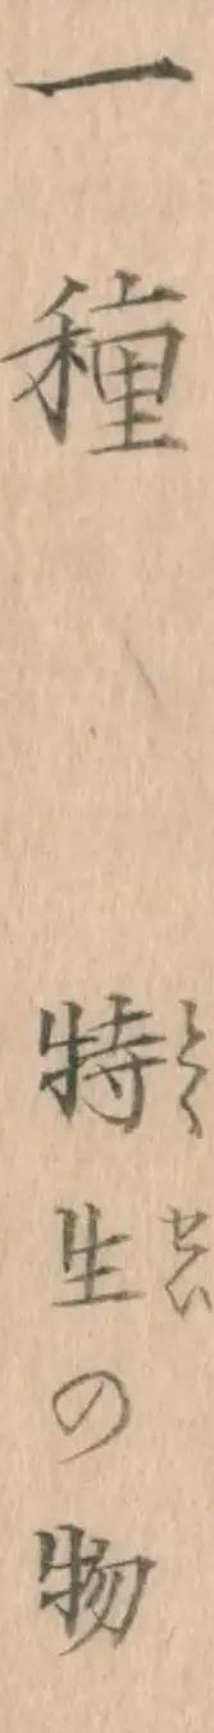一種特生の物
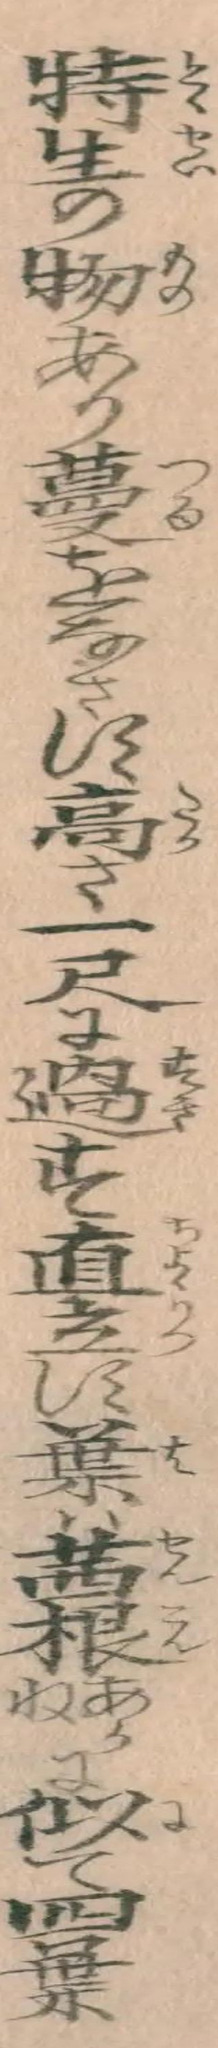特生の物あり蔓をなさす高さ一尺に過す直立す葉は茜根あかねに似て四葉
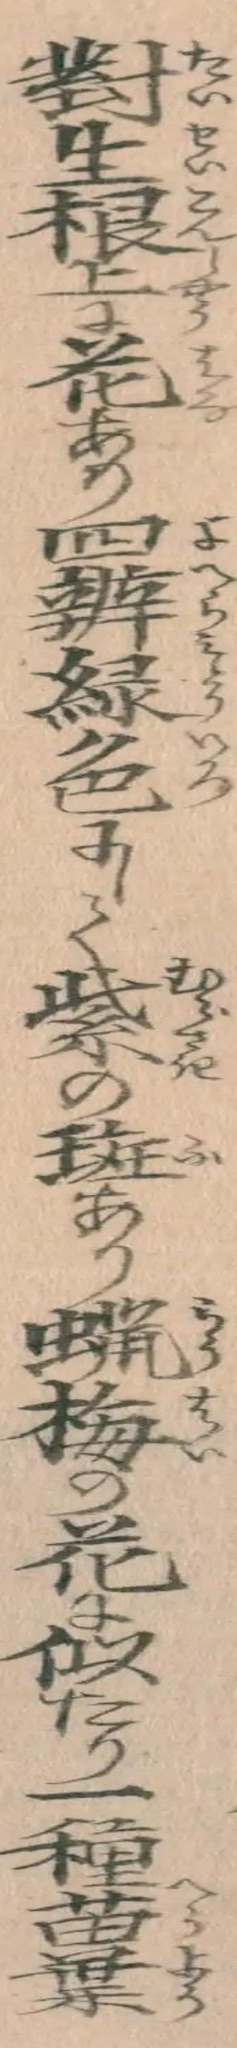対生根上に花あり四弁緑色にして紫の斑あり蝋梅の花に似たり一種苗葉
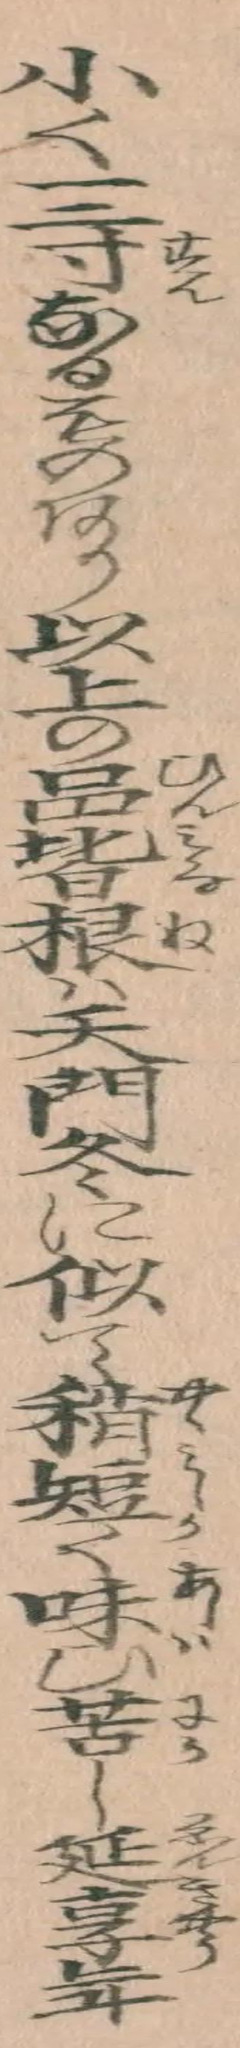小く一二寸なるものあり以上の品皆根は天門冬に似て稍短く味ひ苦し延享年
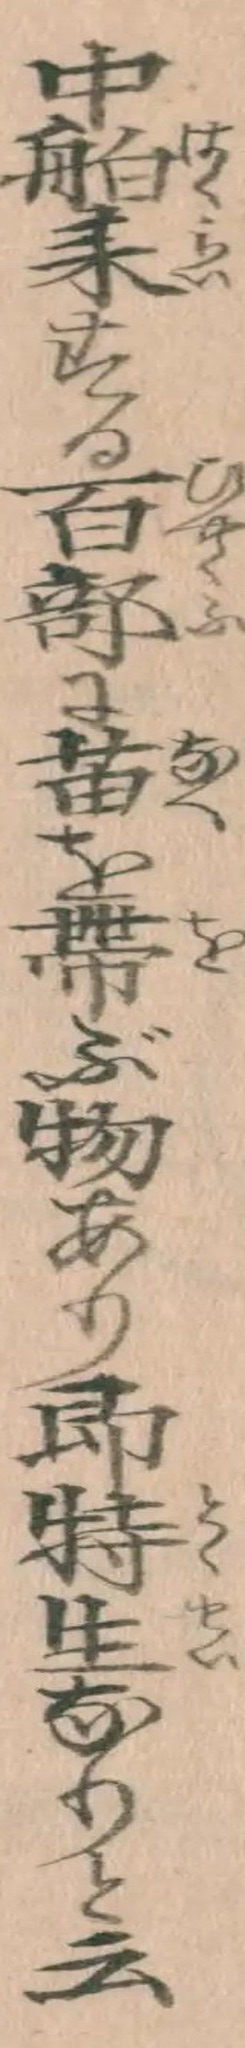中舶来する百部に苗を帯ぶ物あり即特生なりと云
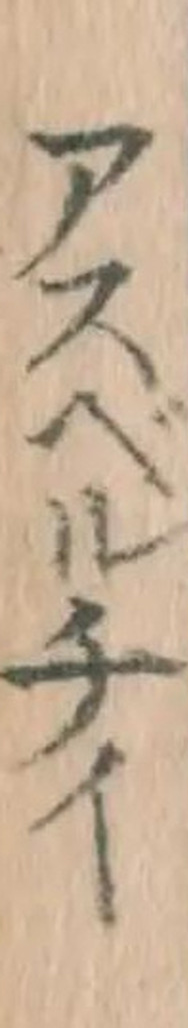アスベルチイ

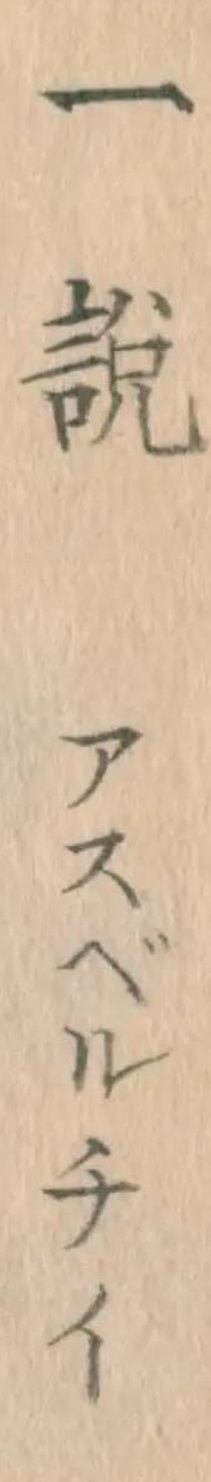一説アルベルチイ

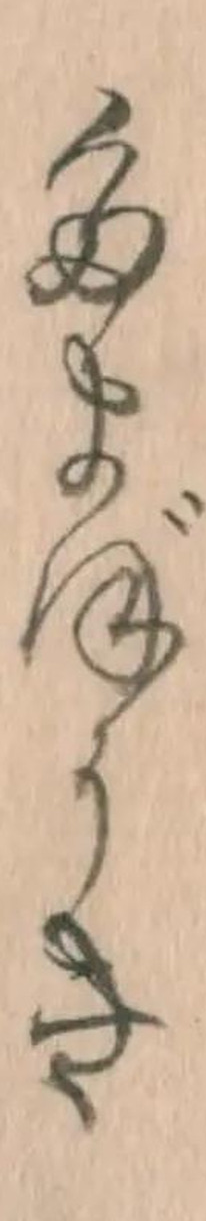たまぼうき
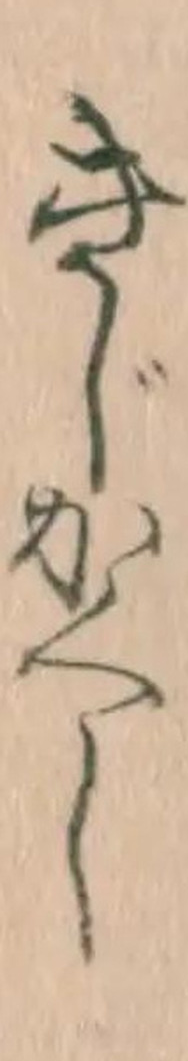きじかくし
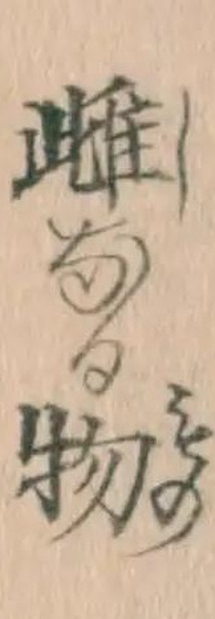雌なる物
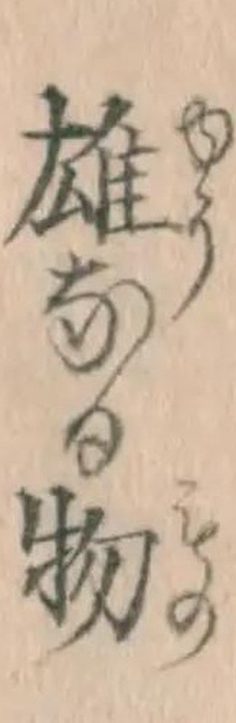雄なる物

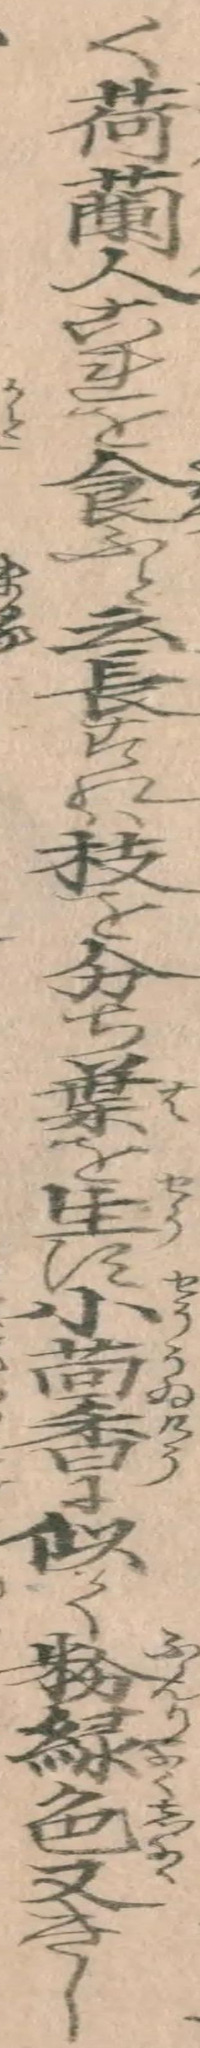く荷蘭人これを食ふと云長すれは枝を分ち葉を生す小茴香に似て粉緑色又きし
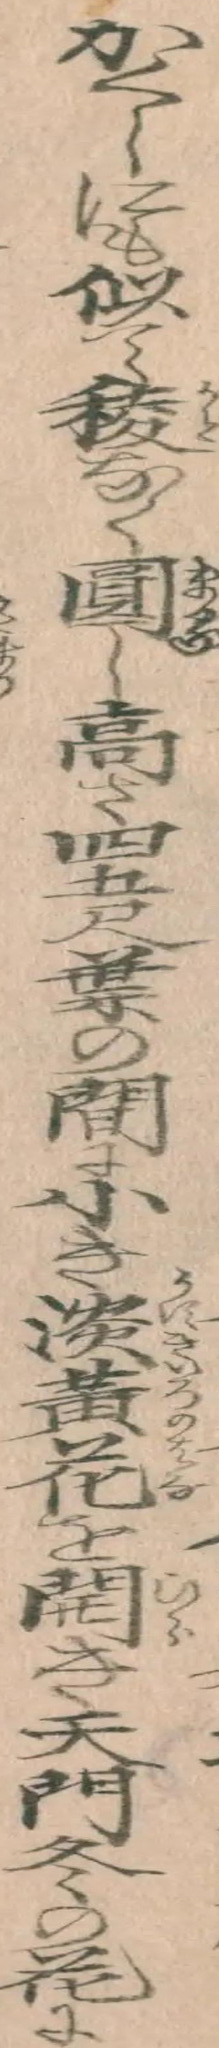かくしにも似て稜なく円し高さ四五尺葉の間に小き淡黄花を開き天門冬の花に
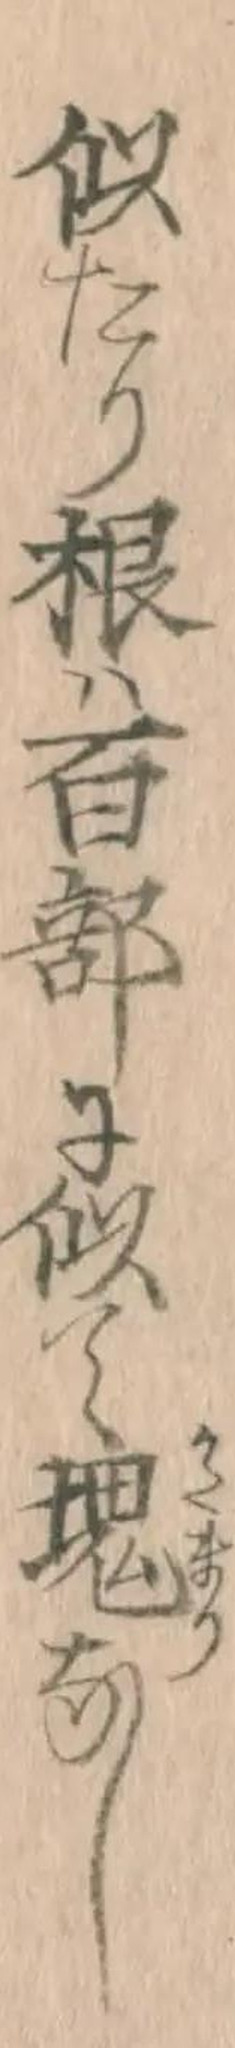似たり根は百部に似て塊なし
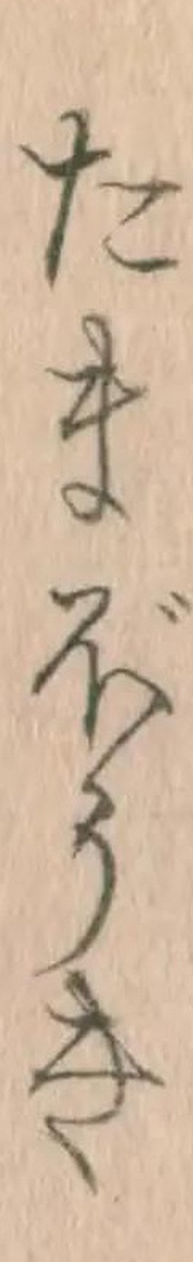一根たまぼうき
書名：本草図譜. 巻28-30
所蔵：国立国会図書館 National Diet Library, JAPAN
